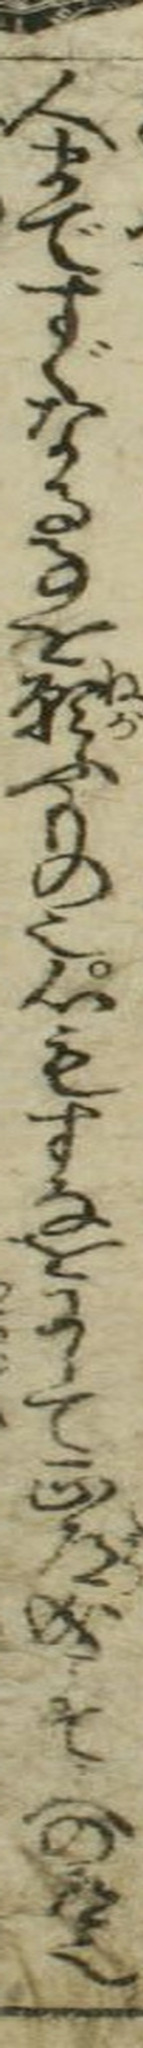人まですぐなる事を願ふもの也。心もすなをにして正道成こそ人の道也
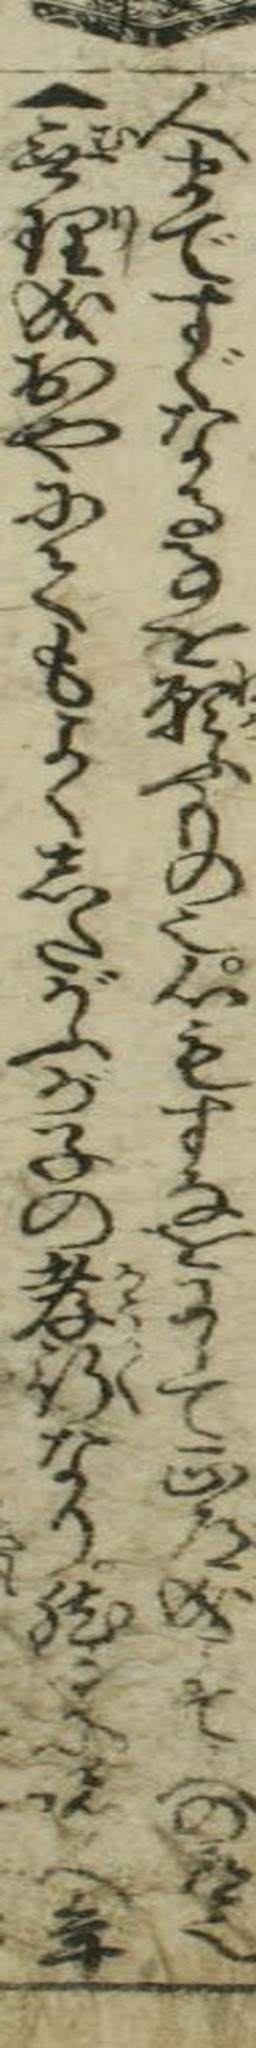▲無理成おやにてもよくしたがふが子の孝行なり。然るにへ年
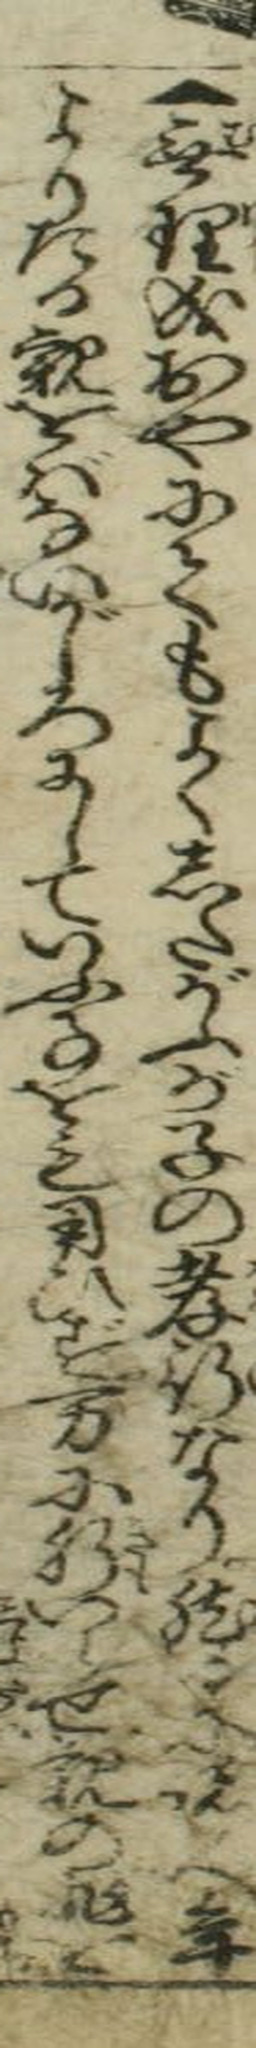よりたる親をばないがしろにしていふ事をも用ひず万に胆いらせ。親のひを
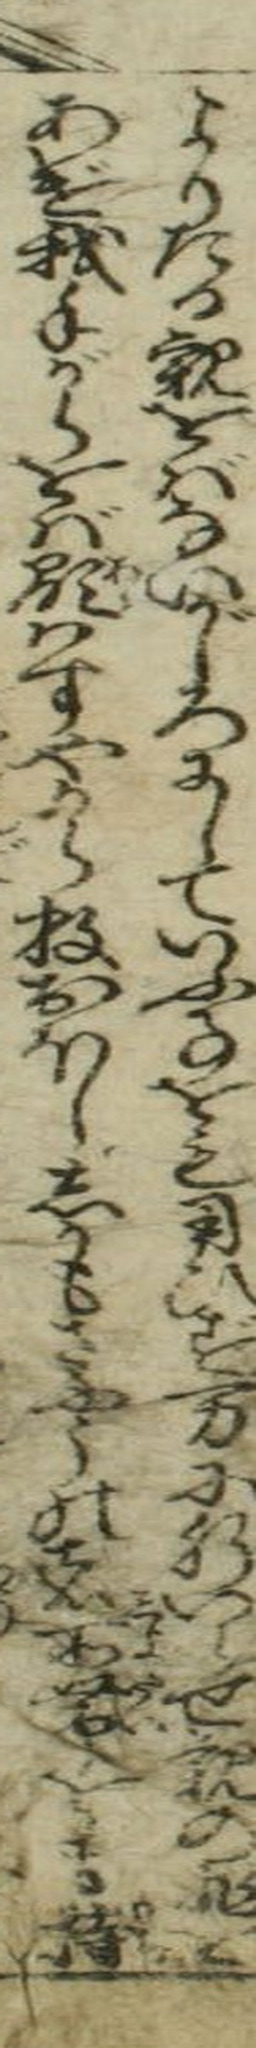あげ我手がらをば顕はすやから数おほし。しかもさやうの者所帯を持
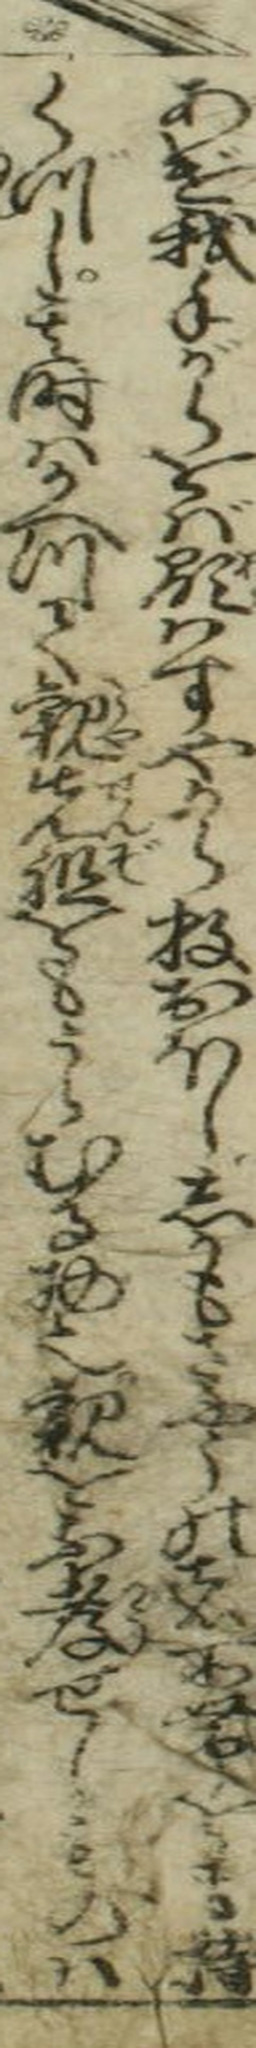くづし。其時はかへつて親先祖をもうらむる物也。親を不孝せしものは
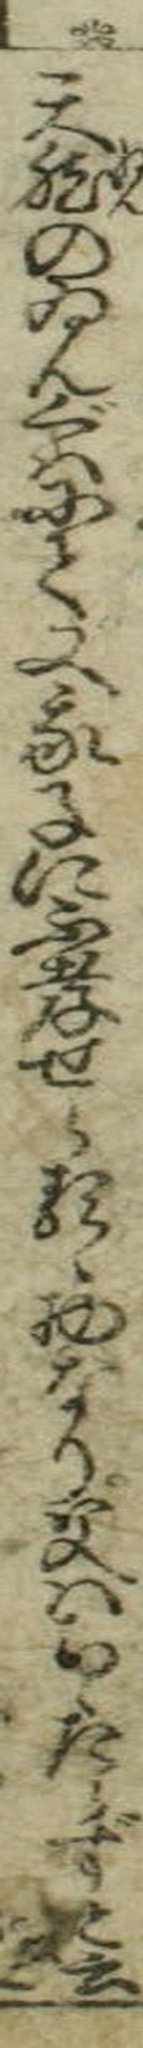天然のゐんぐはにて又我子に不孝せらるゝ物なり。父はちゝたらずと云
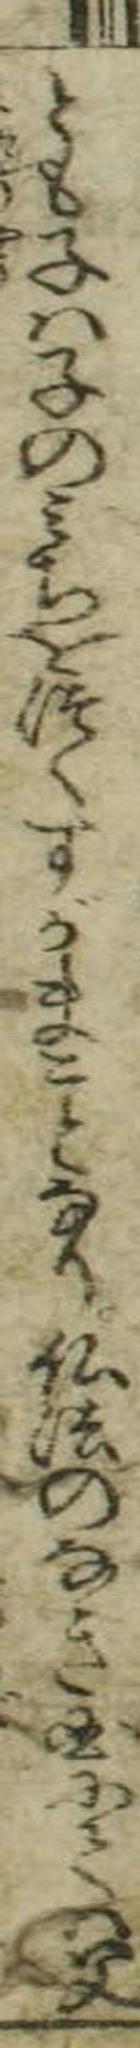とも子は子のみちをつくすがまことなり。仏法のなき国にては。父
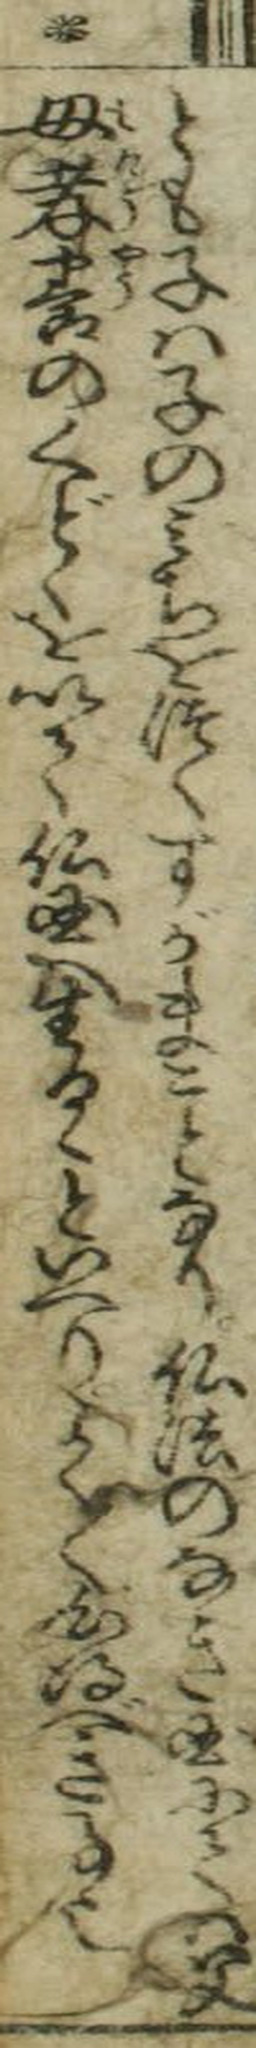母孝養のくどくを以て仏国へ生るゝといへり。よく〳〵心得べき事也

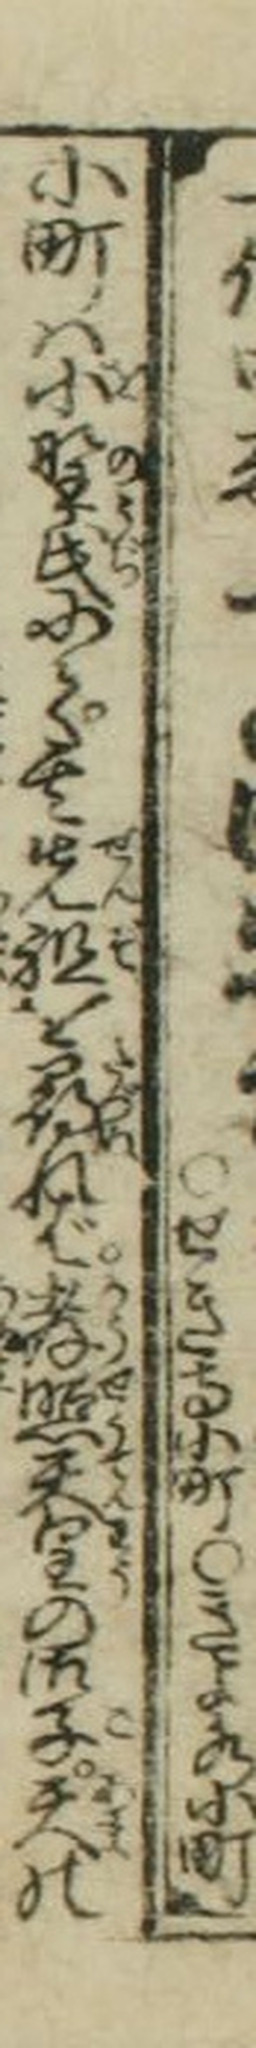小町は小野氏にて。其先祖を尋れば。孝照天皇の御子天の
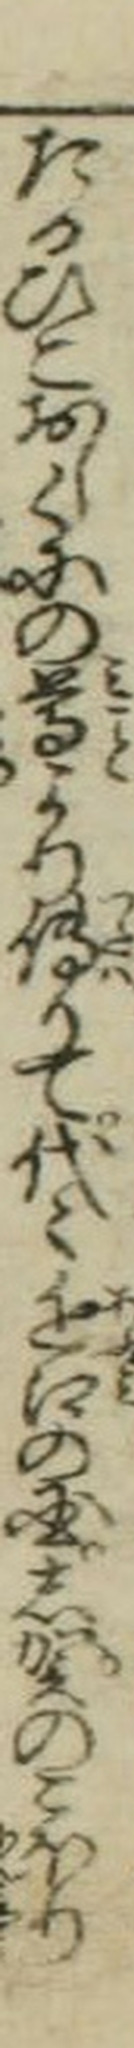たるひこおしくにの尊より傳りて。代々近江の国。志賀のこほり
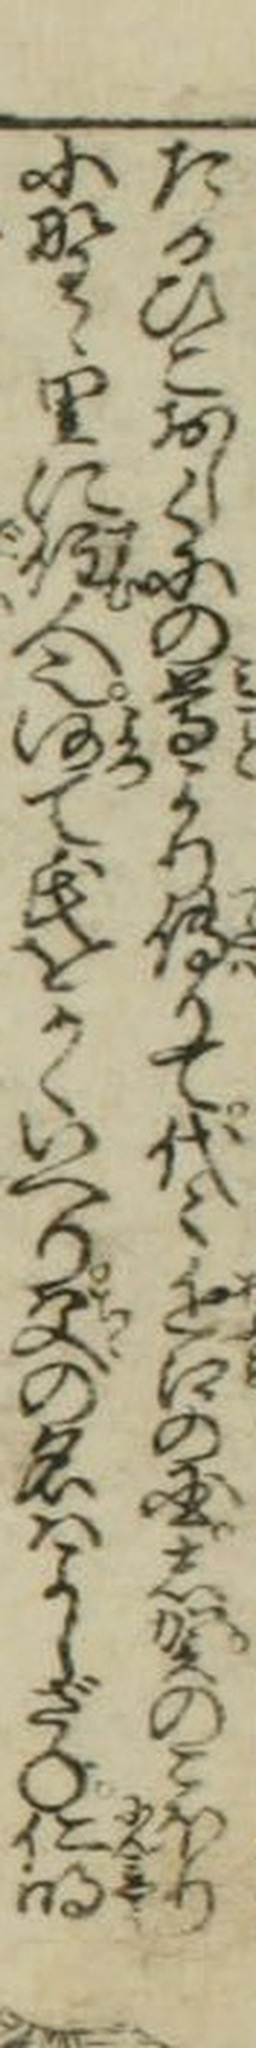小野ゝ里に住人也。依て氏をかくいへり。父の名はよしざ◯仁明
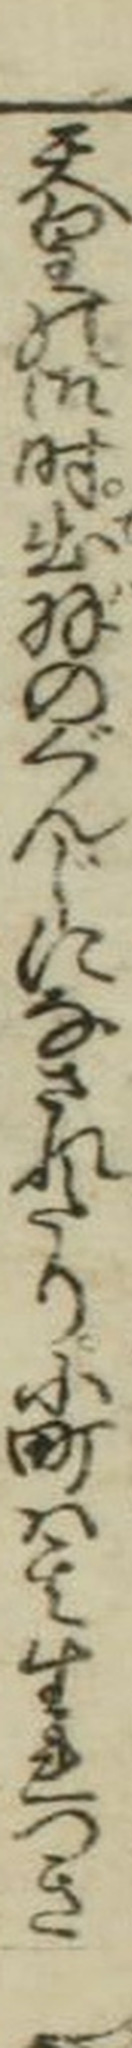天皇の御時。出羽のぐんじになされたり。小町は其生れつき
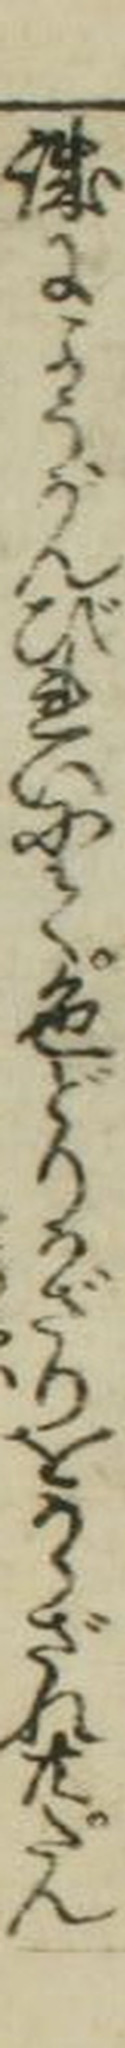誠にようがんびれいにて。色どりかざりをかゝざれ共だん
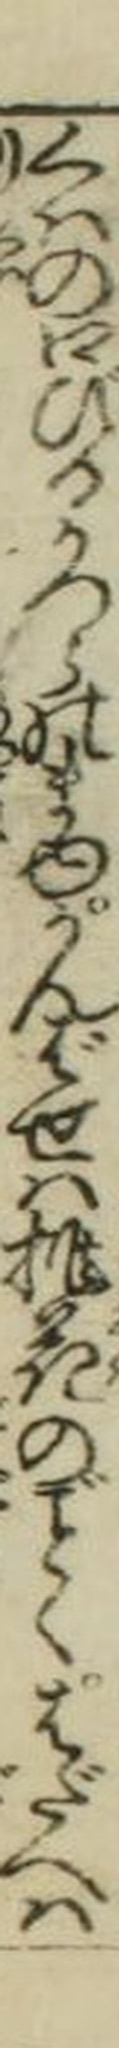くわの口びる桂のまゆ。かんばせは桃花のごとく。はだへは
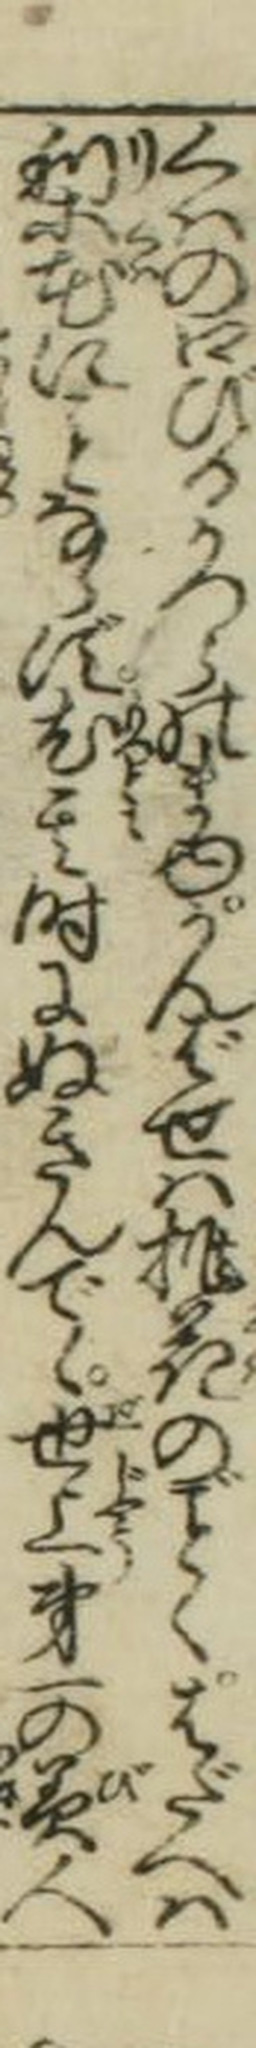梨花にことならず。尤其時にぬきんでゝ。世上第一の美人
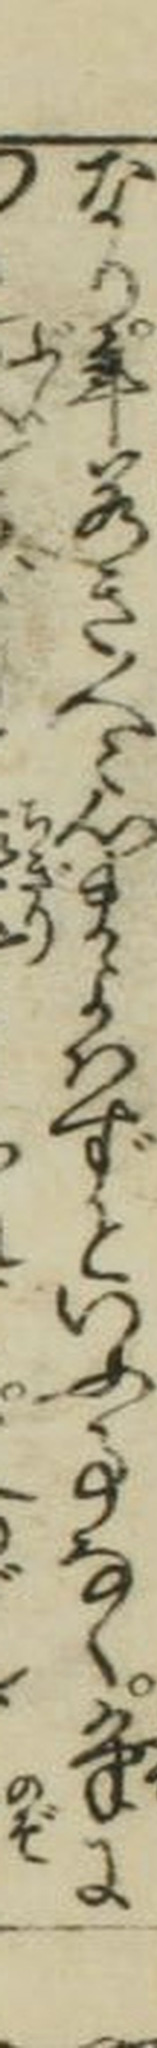なり。年若き人々心まよはずといふ事なく。筆に
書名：女源氏教訓鑑
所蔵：東京学芸大学附属図書館
